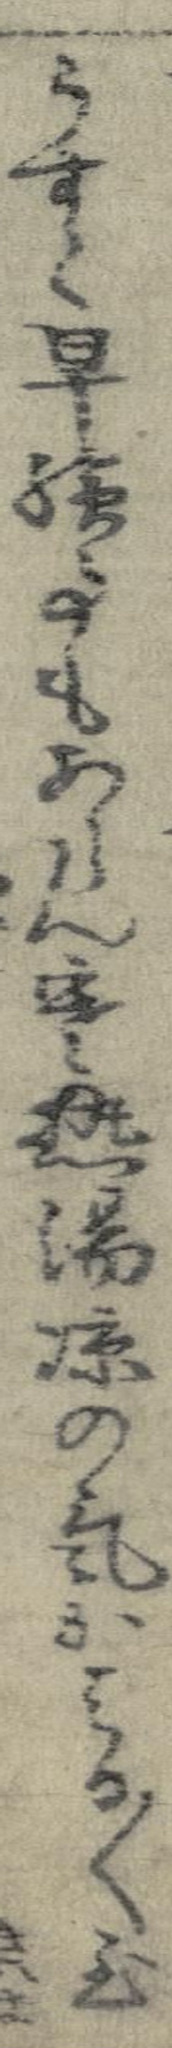うすく早験事もあらん遂に熱湯涼の気かはる〳〵至
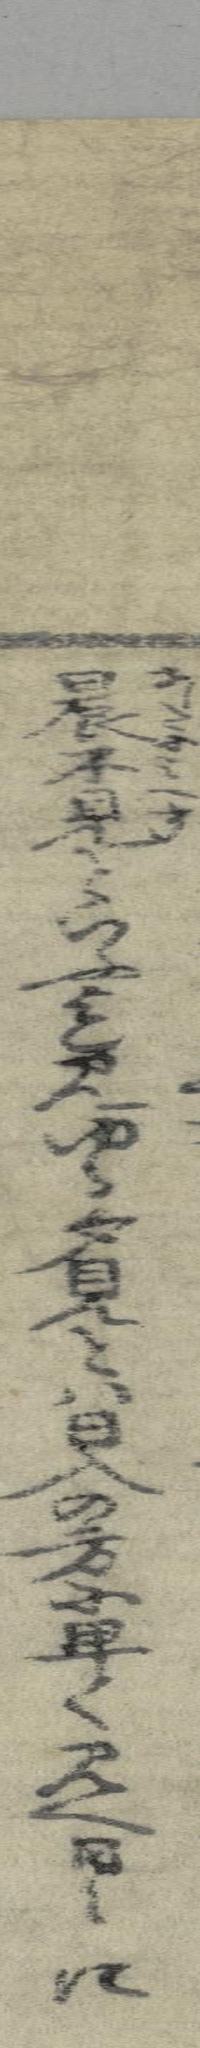晨不見といふ迄見ゆる夕見とは日入の方に卑く見へ日々に
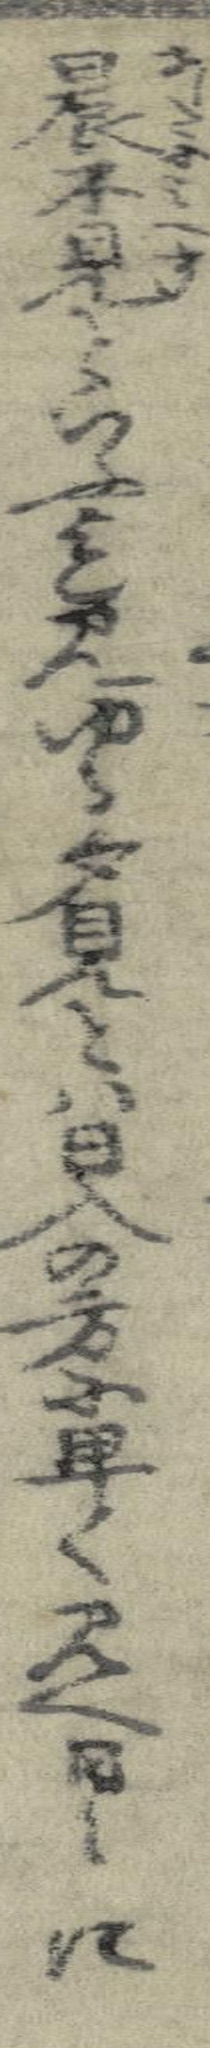晨不見といふ迄見ゆる夕見とは日入の方に卑く見へ日々に
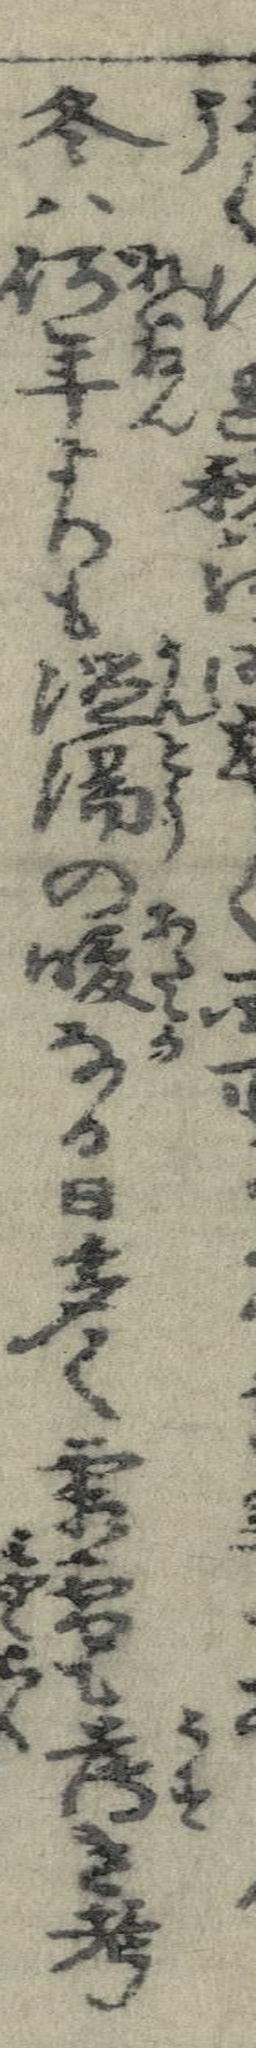冬は例年よりも温湯の暖なる日多く霜雷も薄き考
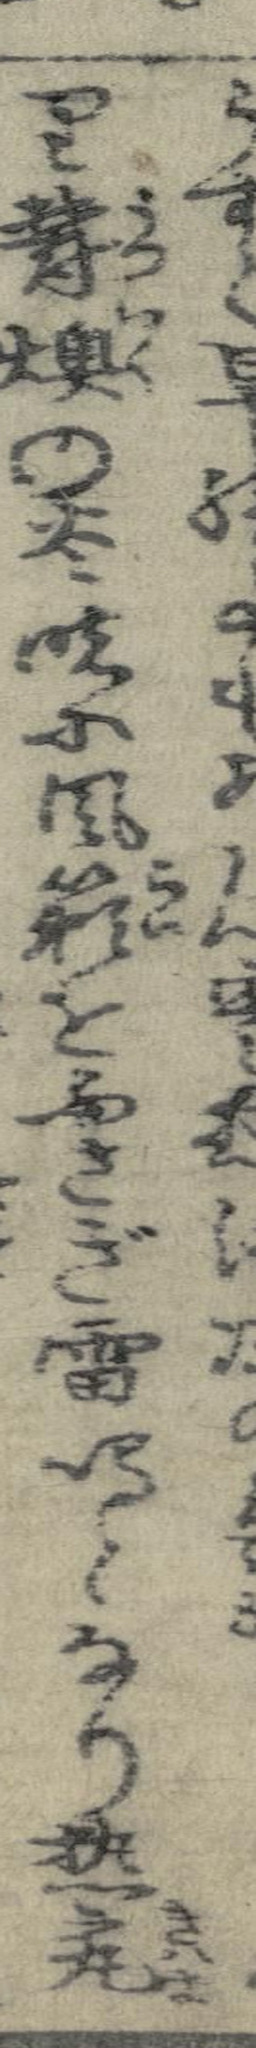り幇燠の炎咳に風籟をふさぎ雷鳴となり熱究
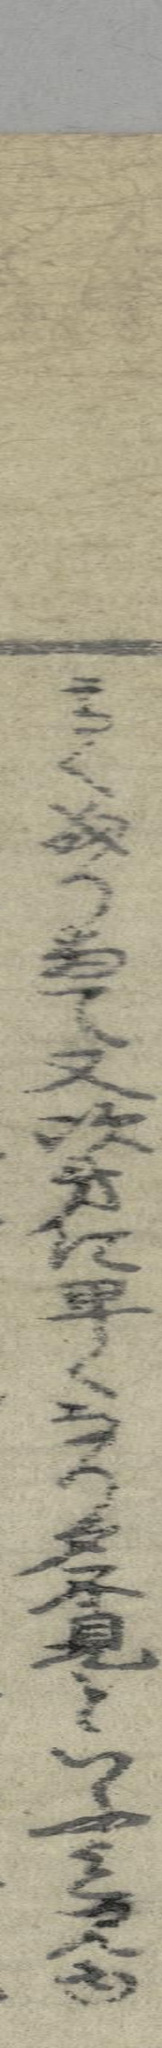高く成り当て又次第に卑くなり夕不見といふ迄見ゆ
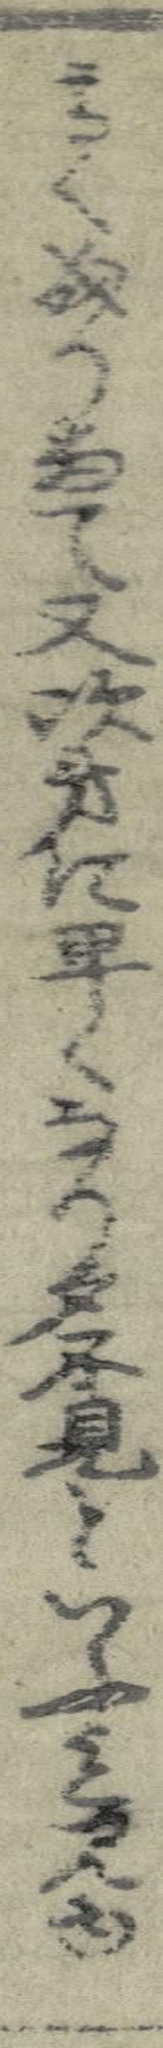高く成り当て又次第に卑くなり夕不見といふ迄見ゆ
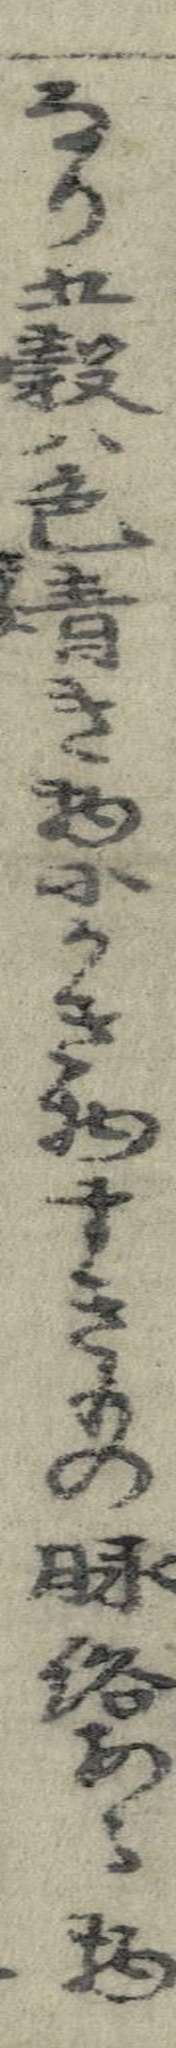なり五穀は色青き物にうき物すきもの脈絡ある物
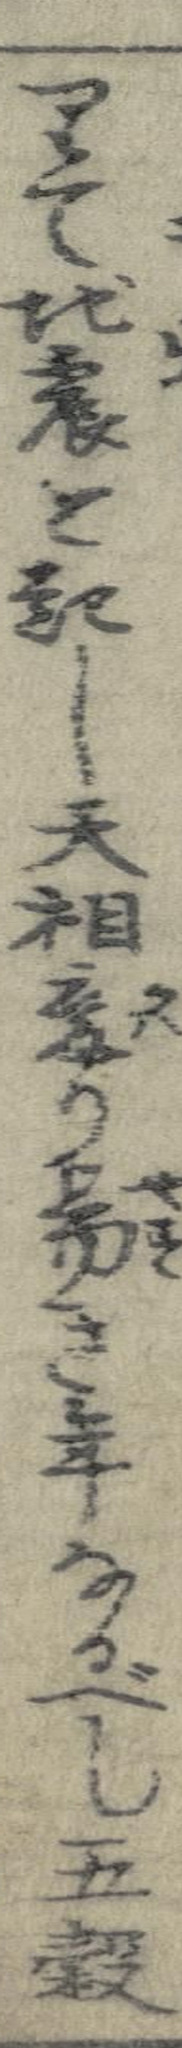りて地震を起し天相変り易き年なるべし五穀
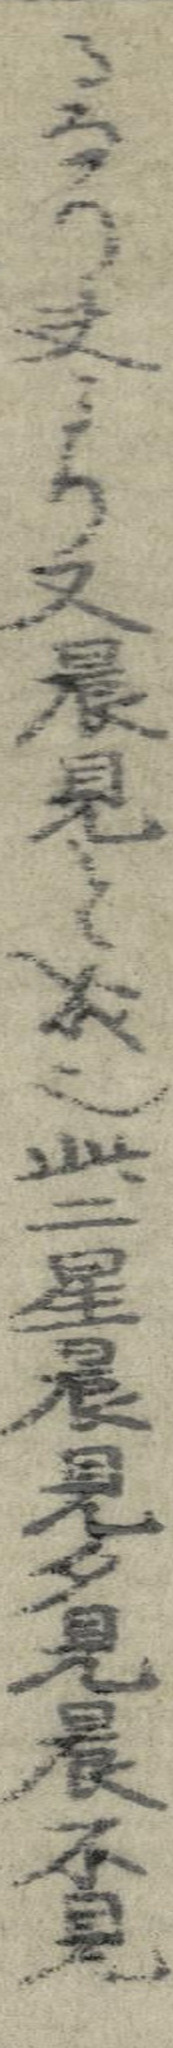るなり夫より又晨見と成也此二星晨見夕見晨不見
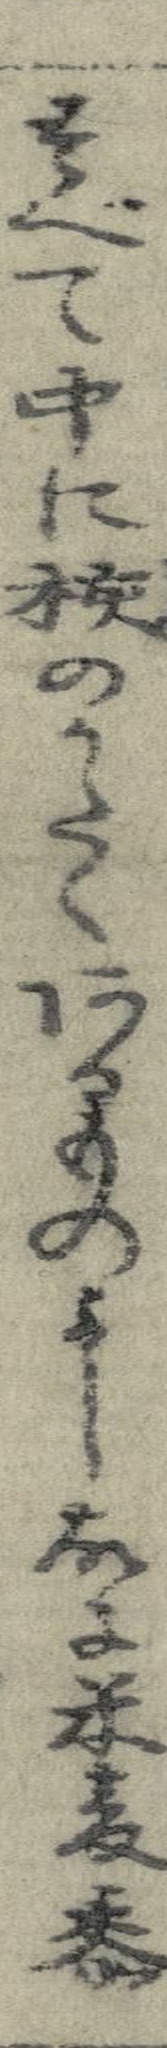すべて中に梜のかたくあるものにし故に米麦黍
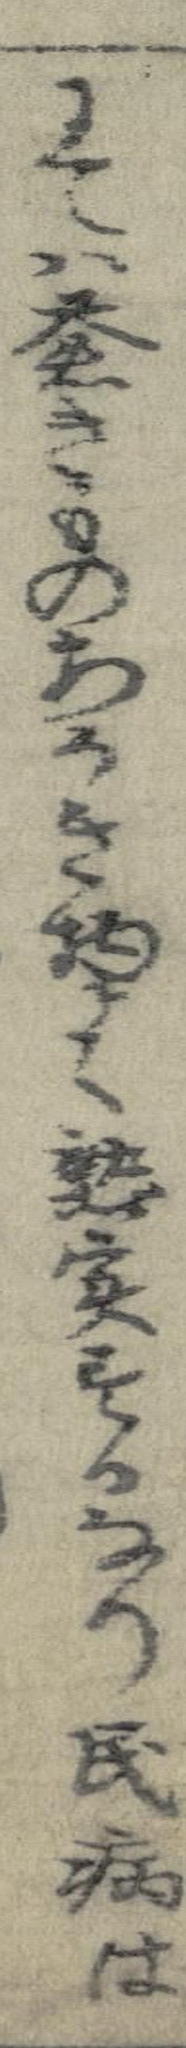にては蚕きものあかき物は熟実するなり民病は
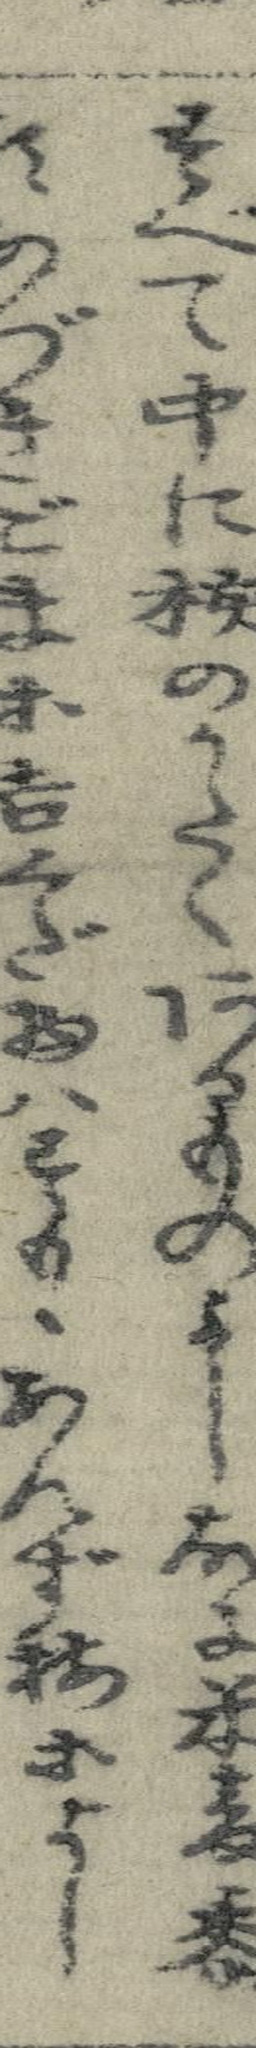類あづきごま等吉くだ物はわもゝあんず梅等よし
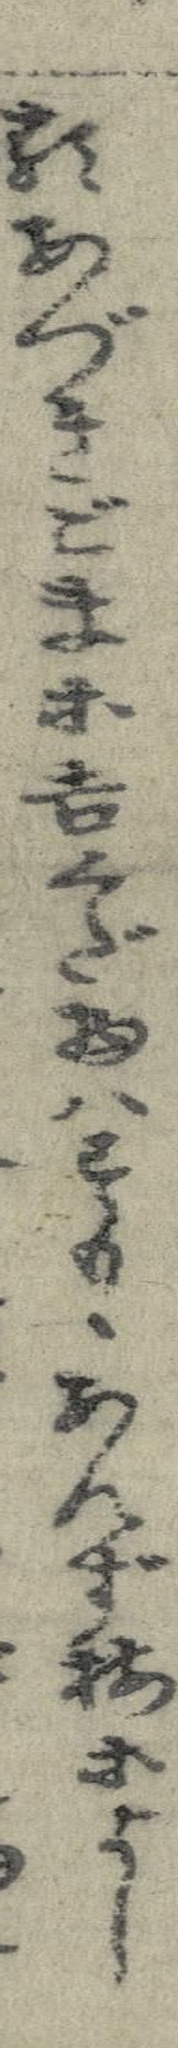類あづきごま等吉くだ物はわもゝあんず梅等よし
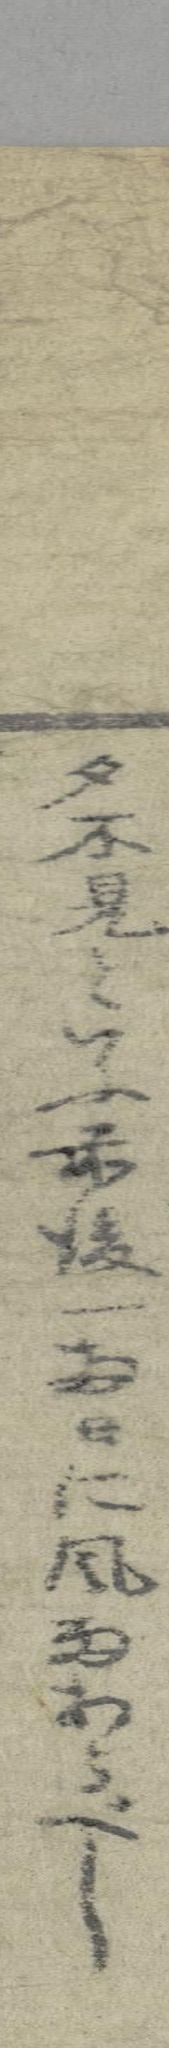夕不見といふ最後一両日に風雨あるべし
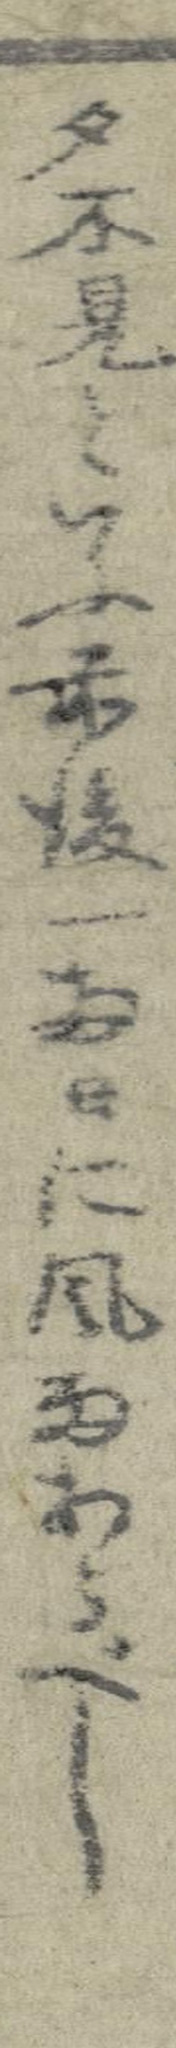夕不見といふ最後一両日に風雨あるべし
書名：天保十六年乙巳七曜　晴雨考　土御門殿御免
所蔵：東京大学地震研究所図書室 Earthquake Research Institute Library, The University of Tokyo, JAPAN
